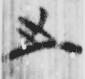之
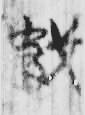○（勤）
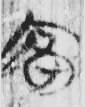客
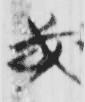或（又）
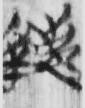執
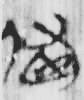○（僕）
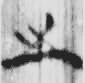之
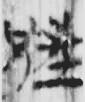○（兄）
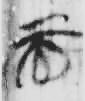而
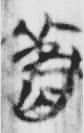舊（久）
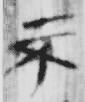不
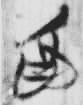爲
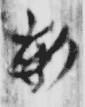○（斷）
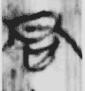君
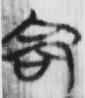命
